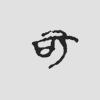可
